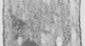五
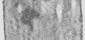十
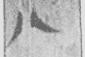八
